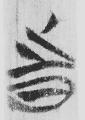{之日}
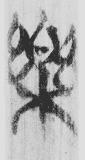樂
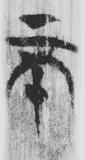不
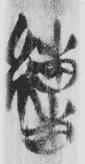{糸東田}
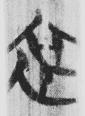哀
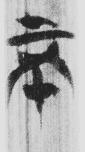不
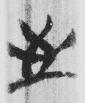至
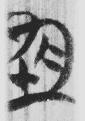均
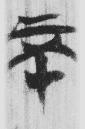不
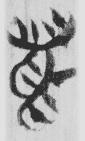{鼠一}
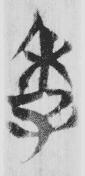季
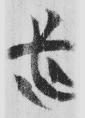必
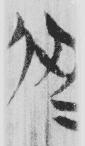仞=
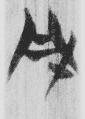凡
